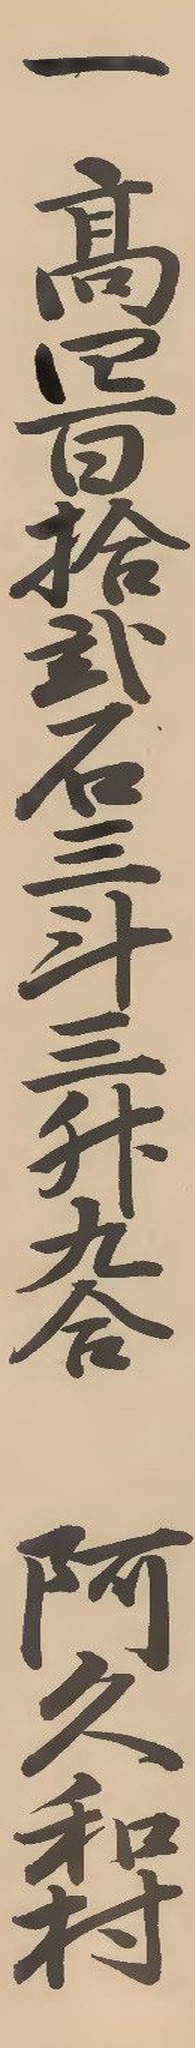一高四百拾弐石三斗三升九合阿久和村
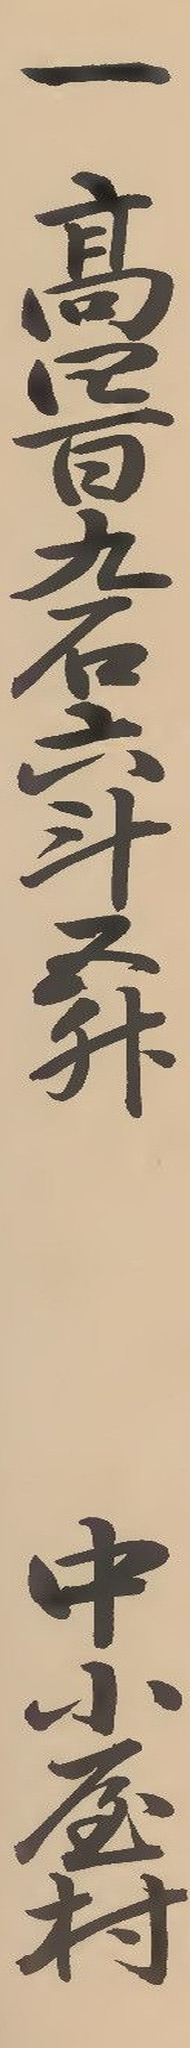一高四百九石六斗五升中小屋村
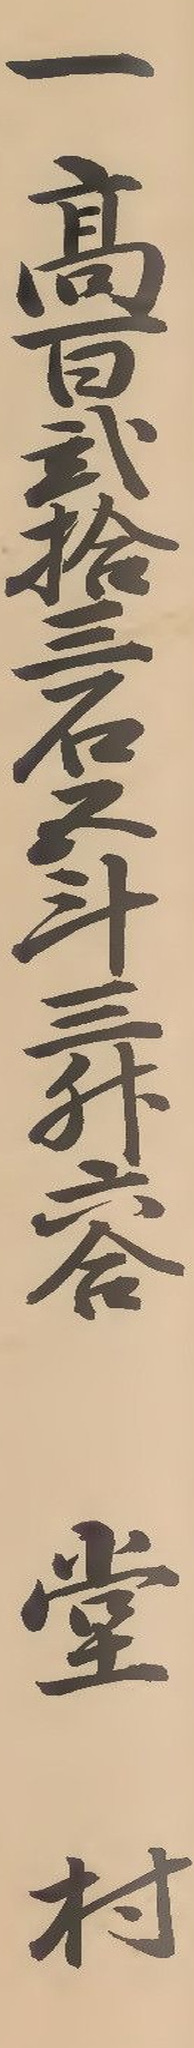一高百弐拾三石五斗三升六合堂村
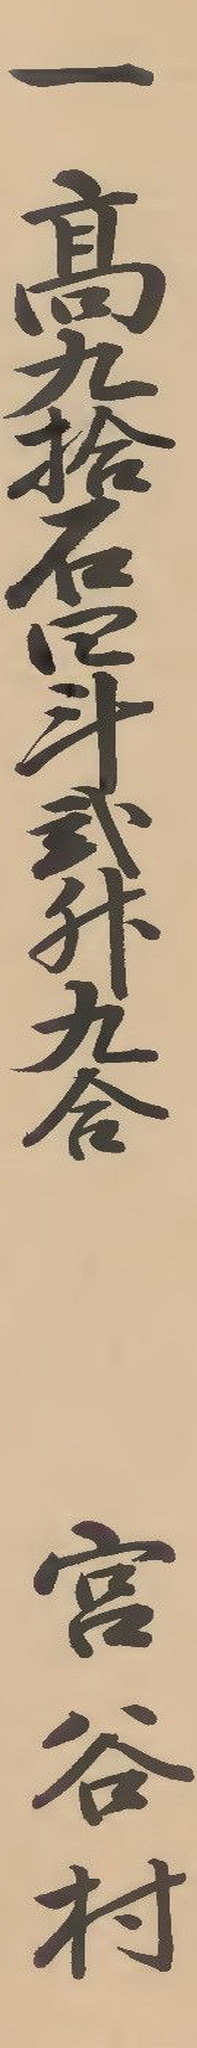一高九拾石四斗弐升九合宮谷村
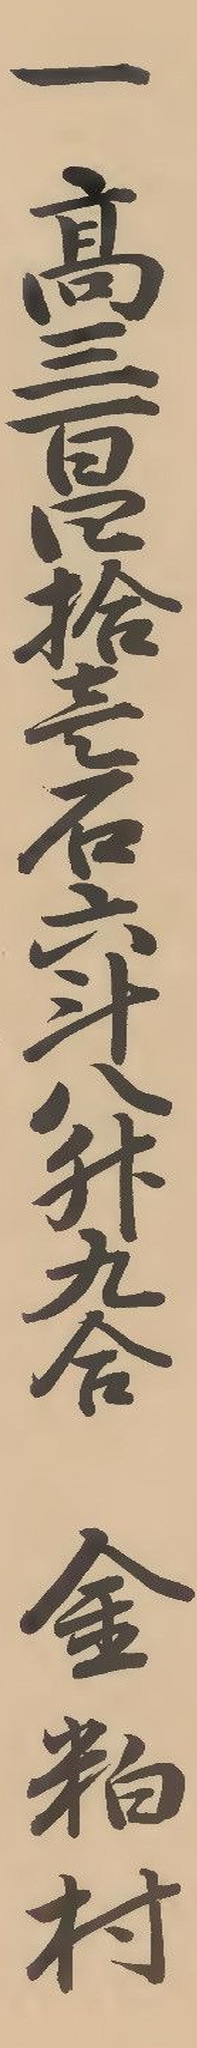一高三百四拾壱石六斗八升九合金粕村
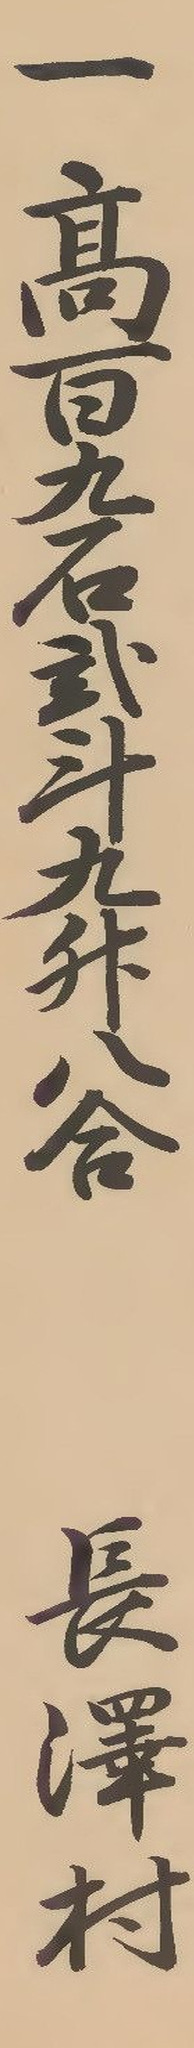一高百九石弐斗九升八合長沢村

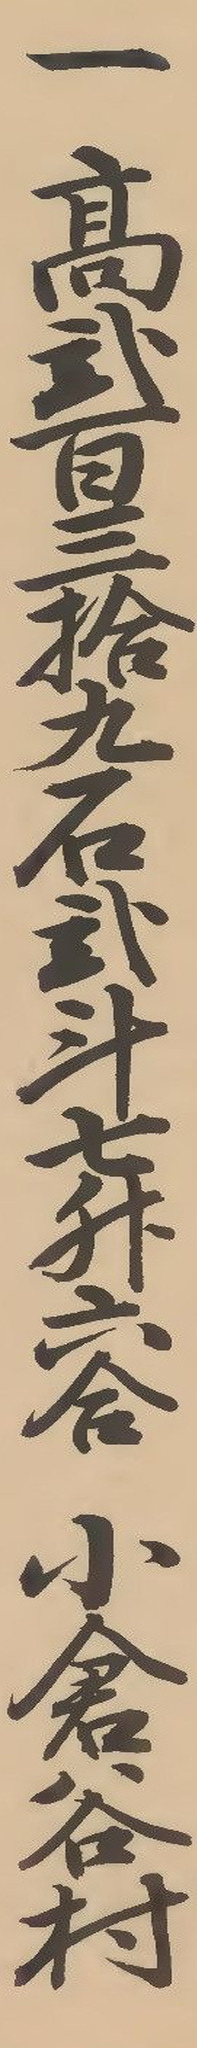一高弐百三拾九石弐斗七升六合小倉谷村
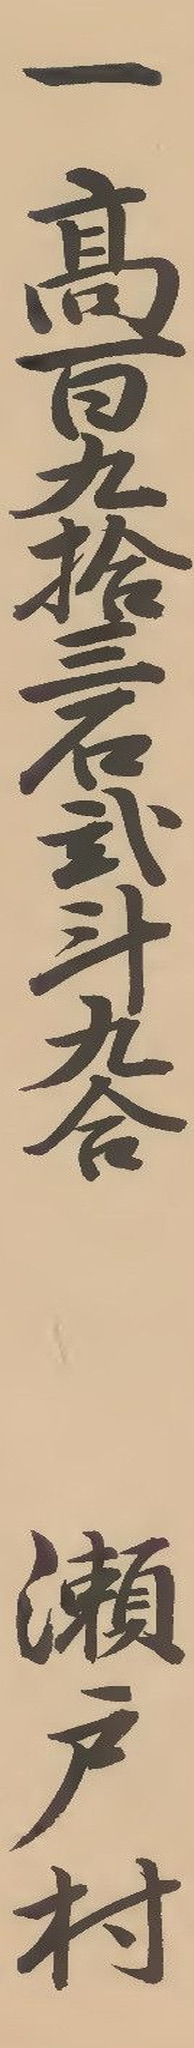一高百九拾三石弐斗九合瀬戸村
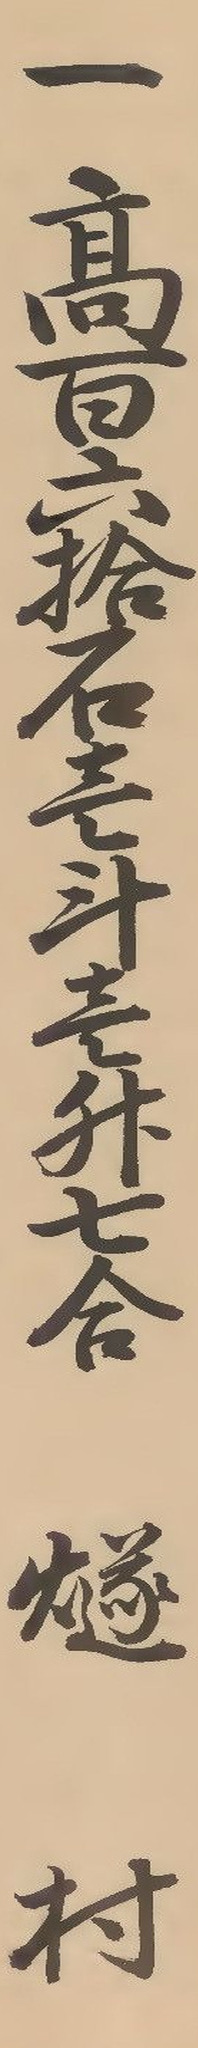一高百六拾石壱斗壱升七合燧村
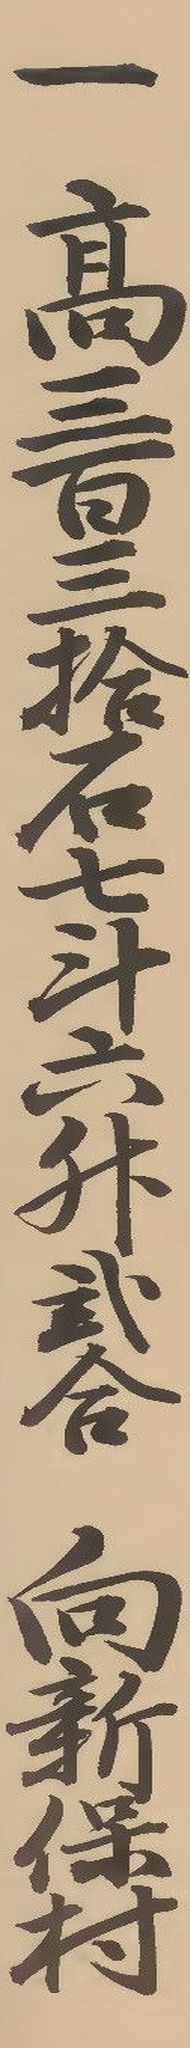一高三百三拾石七斗六升弐合向新保村
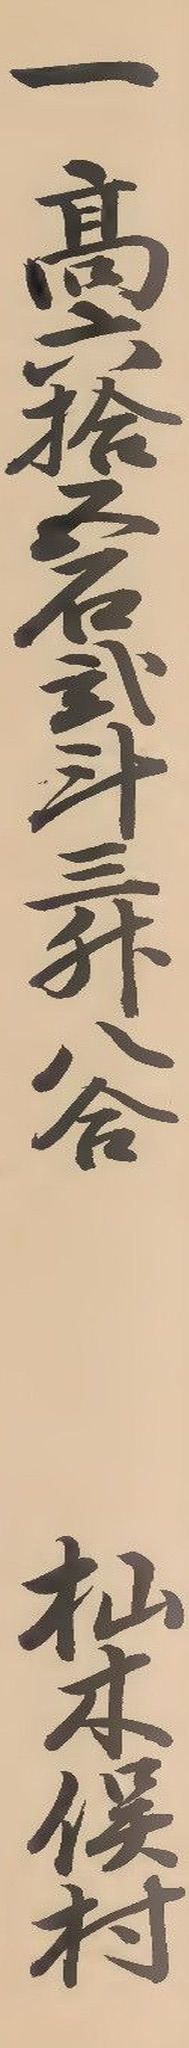一高六拾五石弐斗三升八合杣木俣村
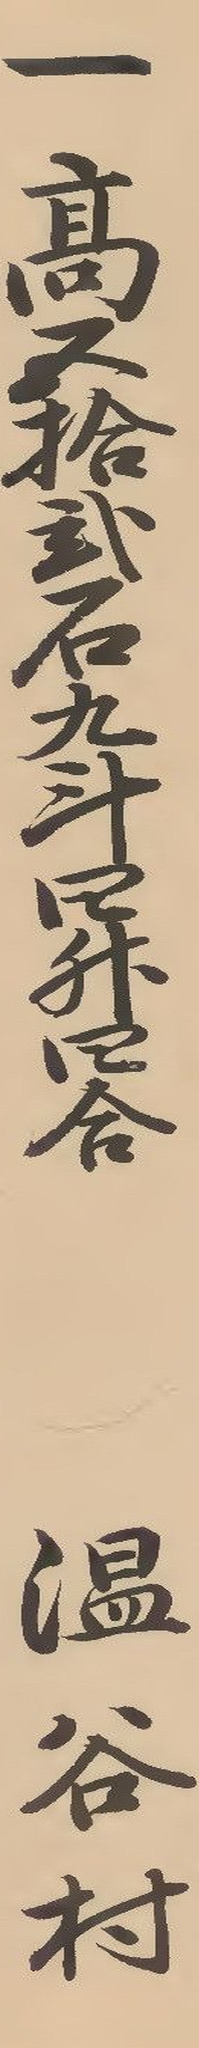一高五拾弐石九斗四升四合温谷村
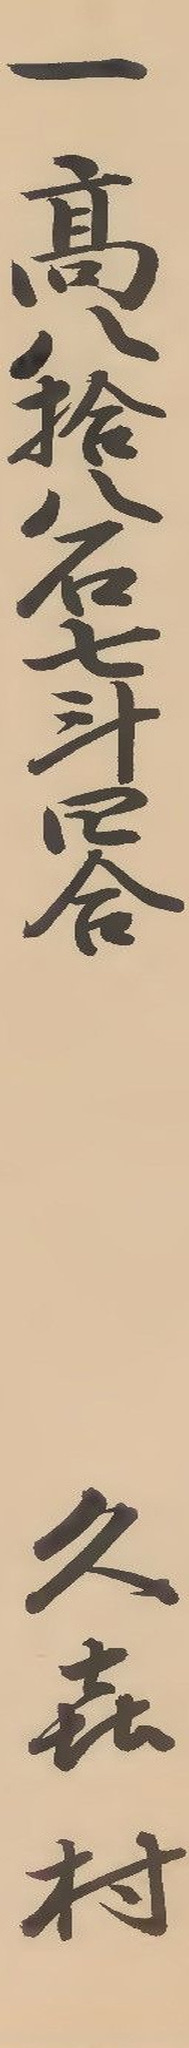一高八拾八石七斗四合久喜村
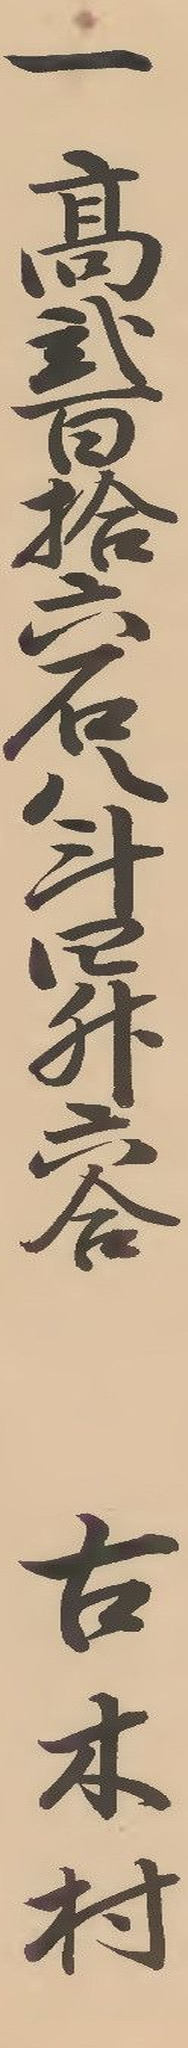一高弐百拾六石八斗四升六合古木村

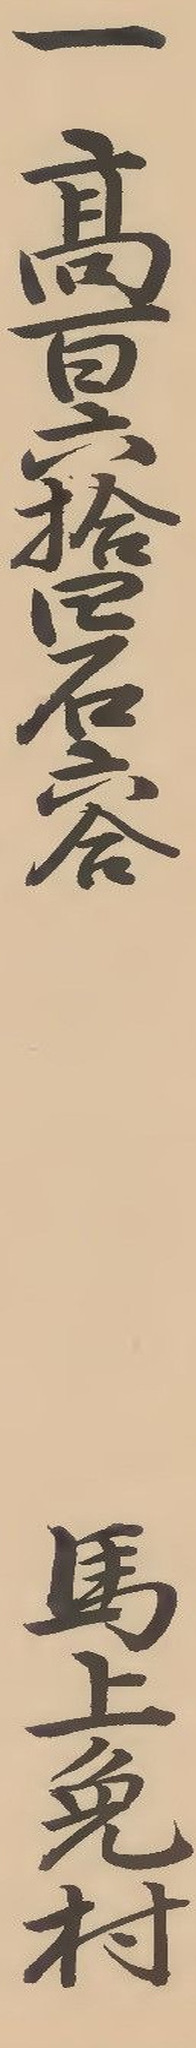一高百六拾四石六合馬上免村
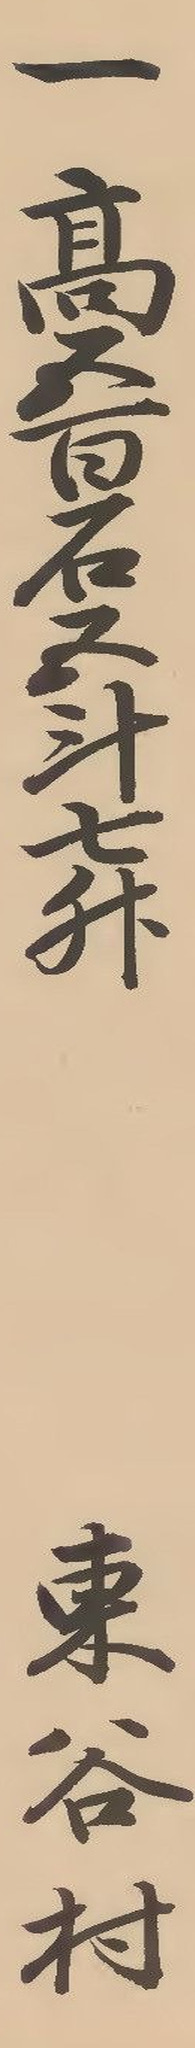一高五百石五斗七升東谷村
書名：越前国郷帳
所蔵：国立公文書館 National Archives of Japan
